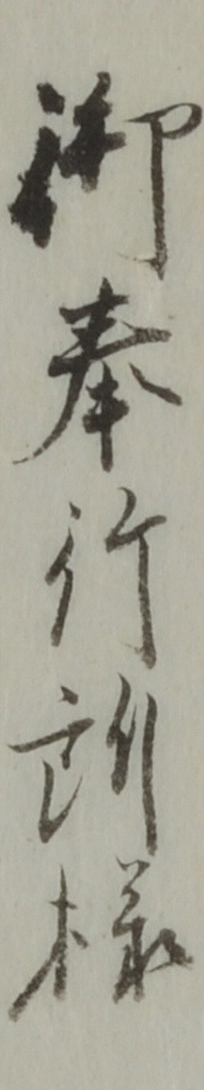御奉行所様

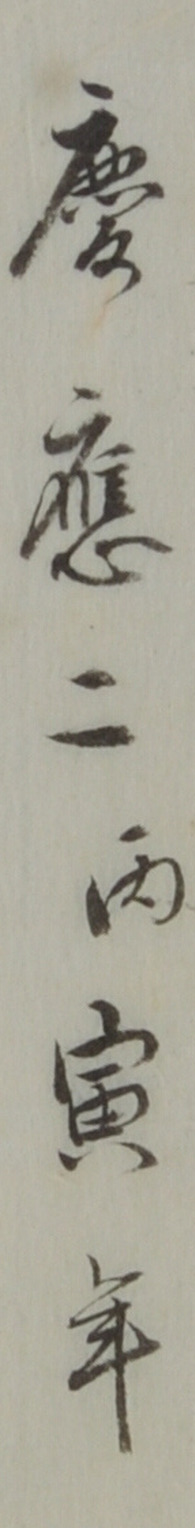慶応二丙寅年
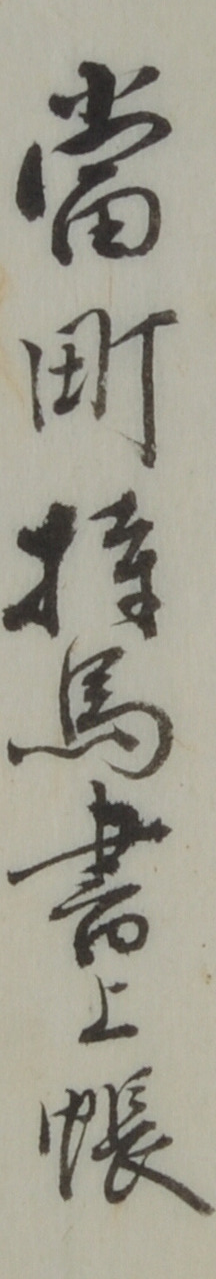当町持馬書上帳

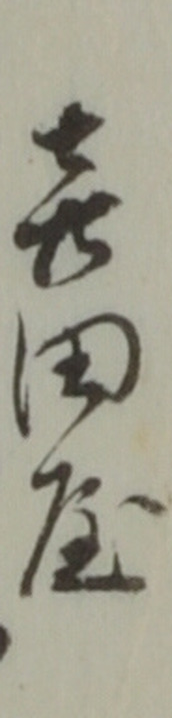喜田屋
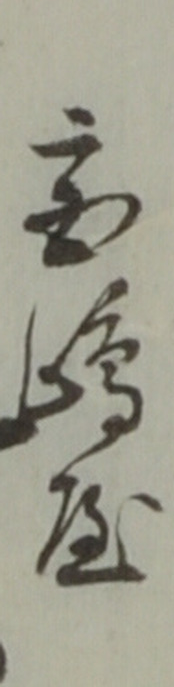宮嶋屋
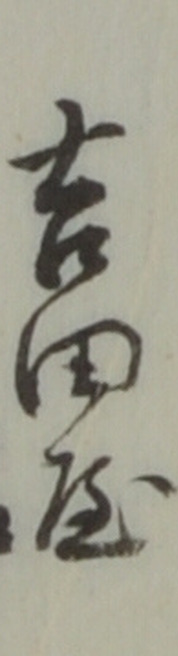吉田屋

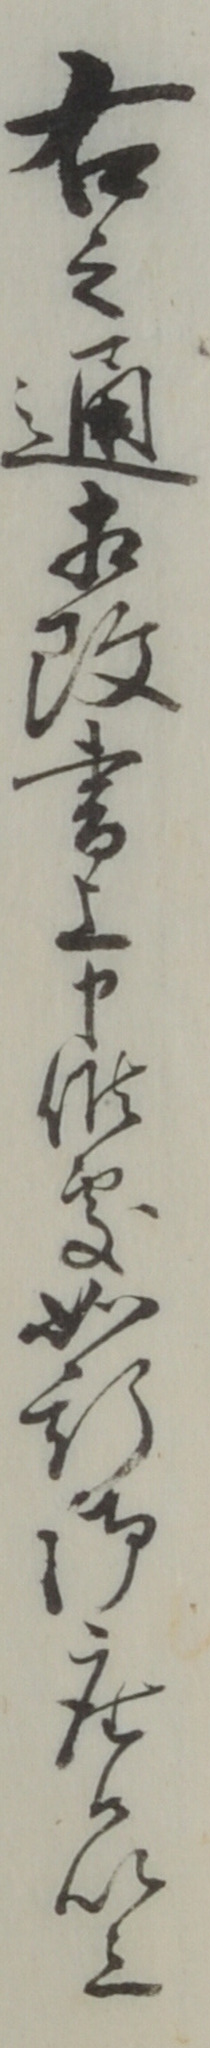右之通相改書上申候処如斯御座以上
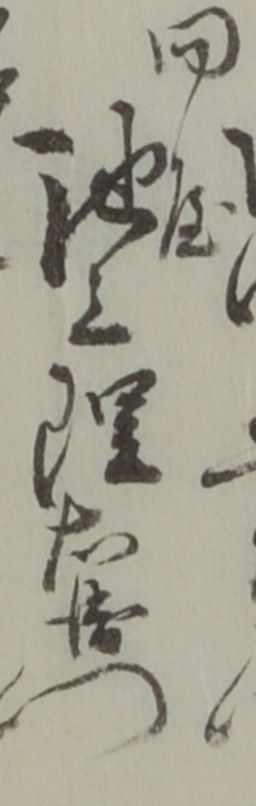池上理右衛門
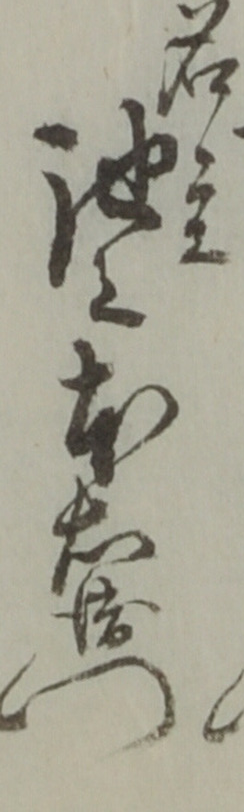池上本右衛門
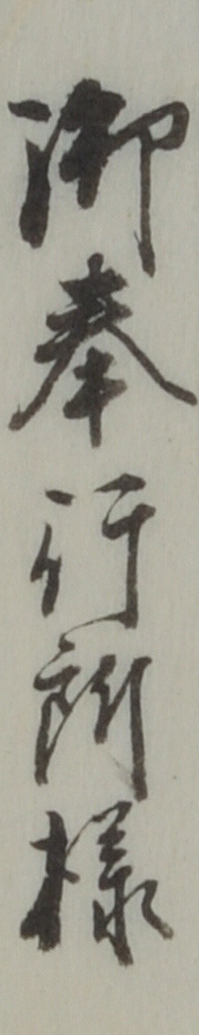御奉行所様

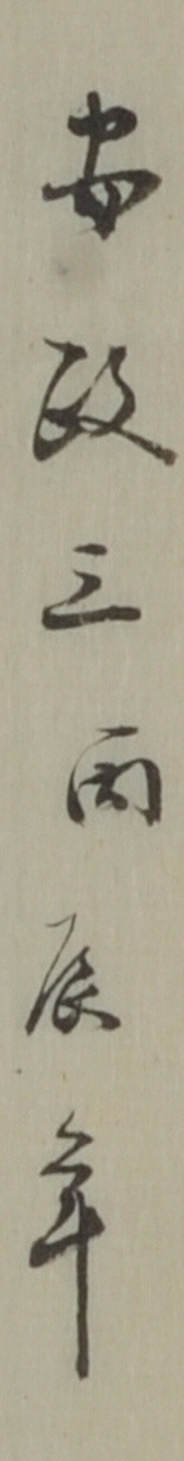安政三丙辰年
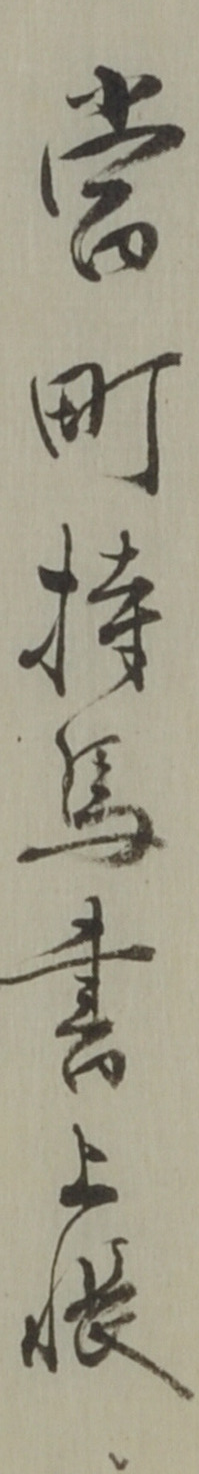当町持馬書上帳

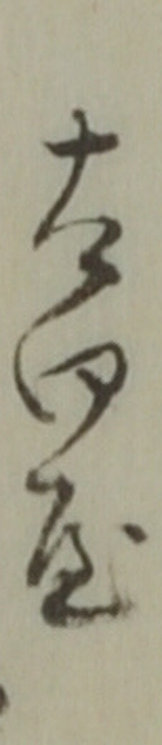太田屋
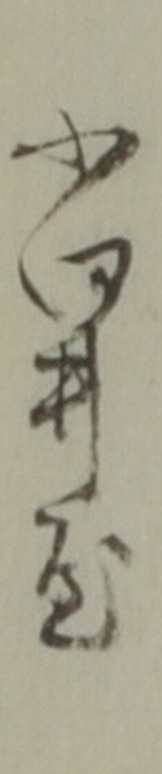小田井屋

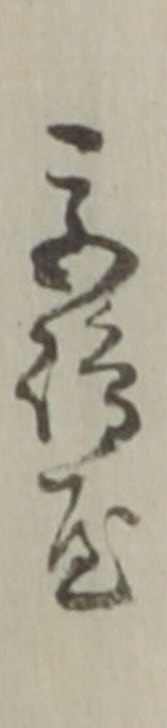宮嶋屋
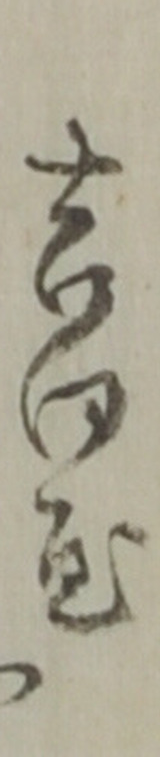吉田屋
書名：當町持馬書上帳
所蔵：伊那市立高遠町図書館・合同会社AMANE
